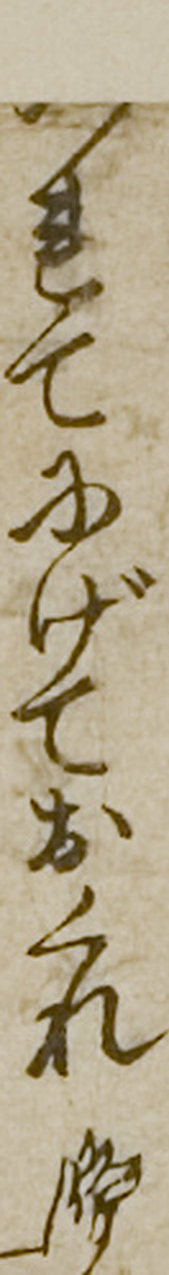つれてにげておくれよふ
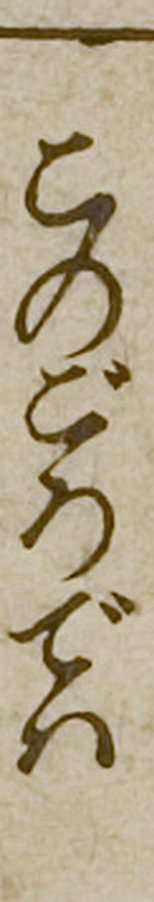このごろでは
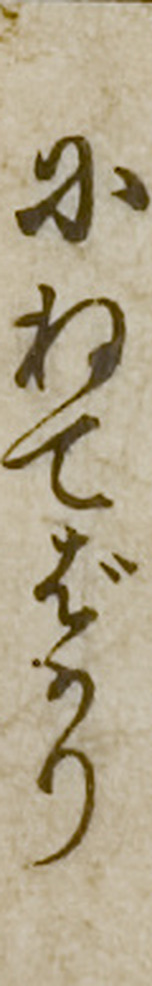にねてばかり
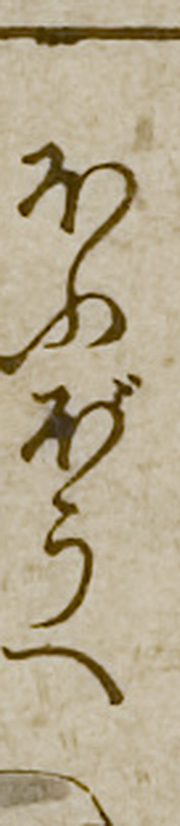ほふぼうへ
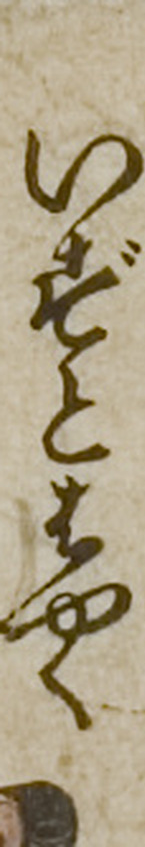いずとはやく
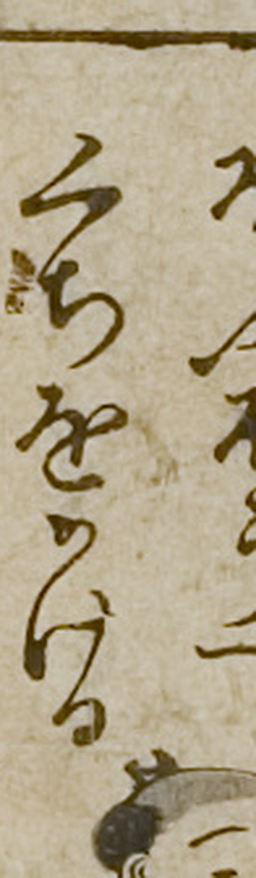くちをかける
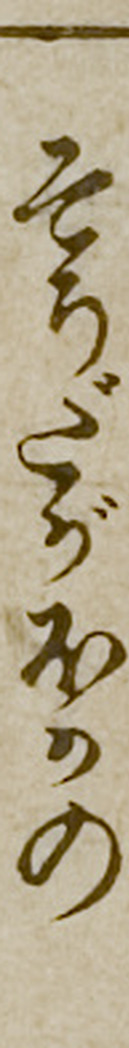そうだがほかの
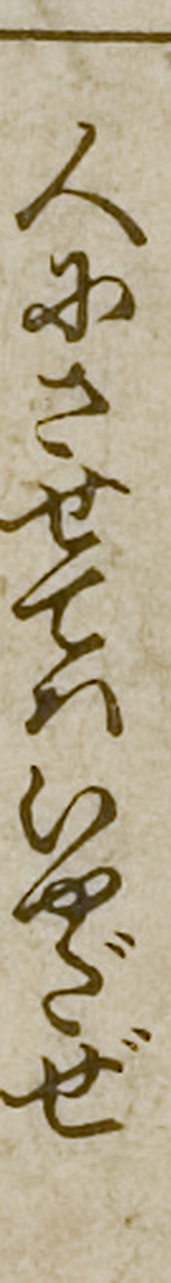人にさせてはいやだぜ
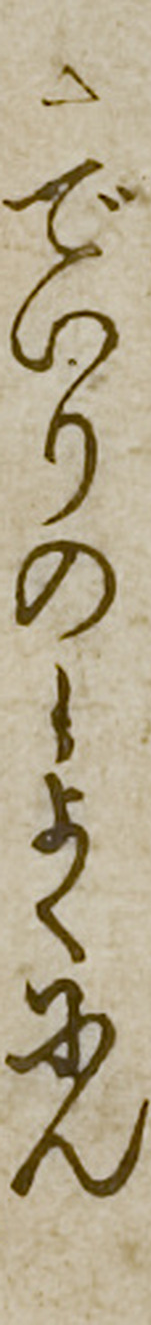△でいりのしよくにん
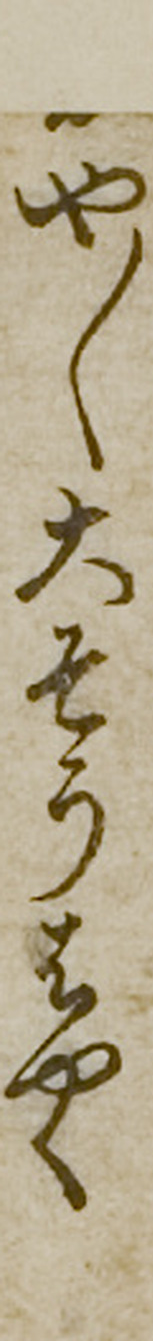や〳〵大そうはやく
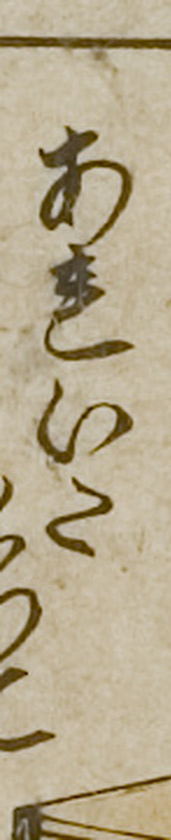あれいたくつて
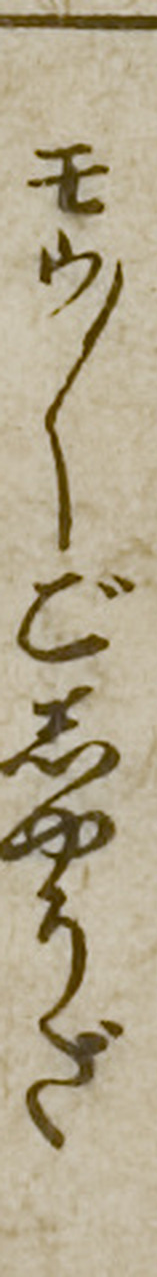もう〳〵ごしやうだ
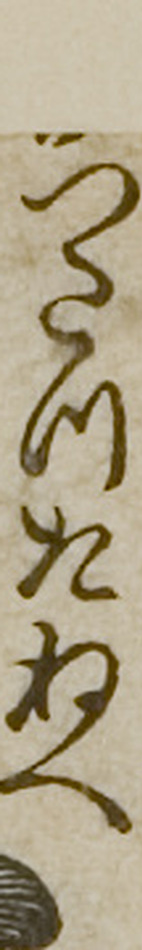つたつたねへ
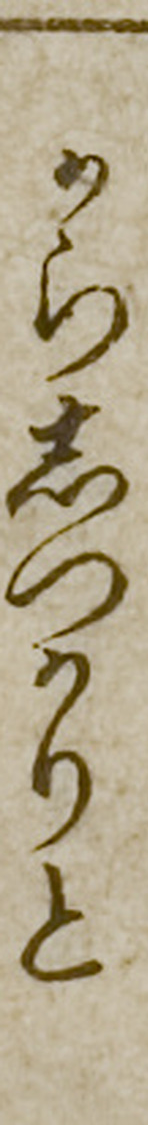からしつかりと
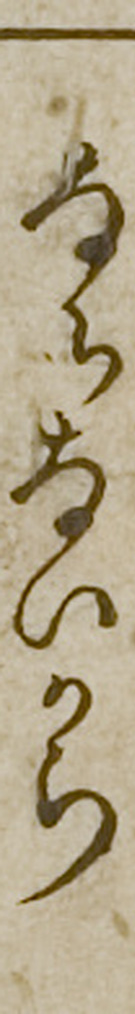ならないから
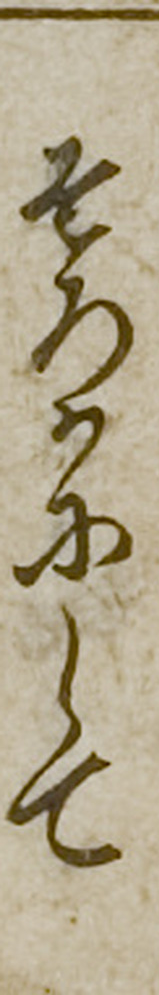そろかにして
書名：[地震世相かるた]
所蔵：東京大学総合図書館 General Library in the University of Tokyo, JAPAN
